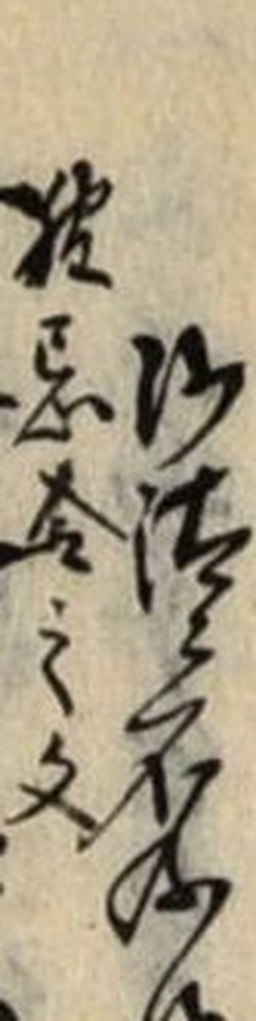服忌令之文
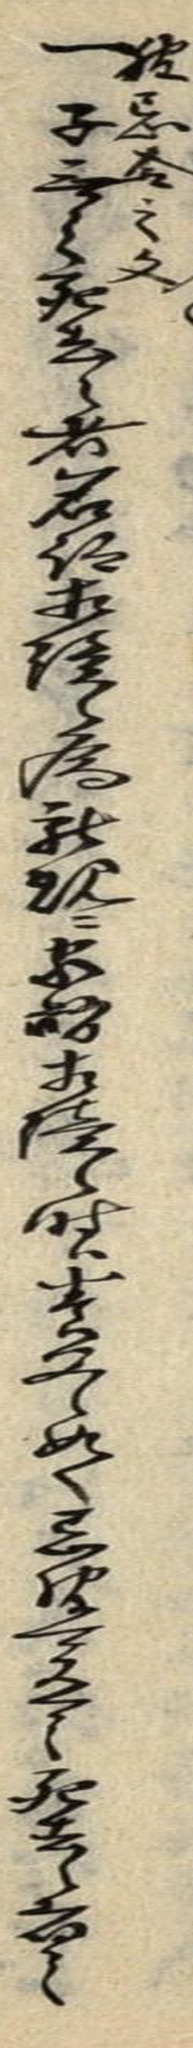一子無之死去之者名跡相続候為新規に家督相続候時は養子之如く忌服可有之死去之者之
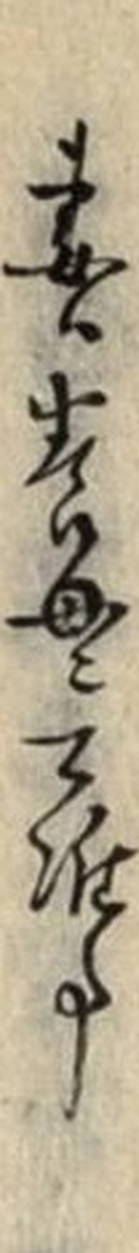妻は養母に可准事
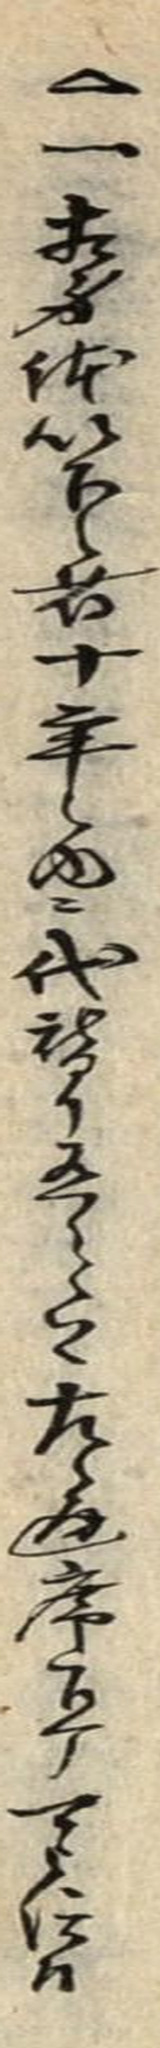△一相身体以下之者十年之内に代替り有之候はゝ左之通席下ケ可被仰付
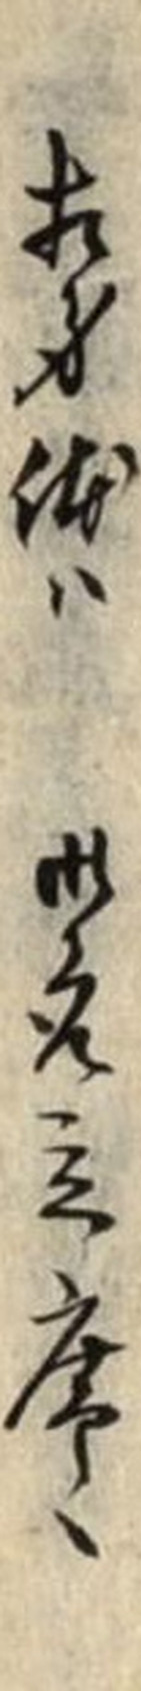相身体は御取立席へ
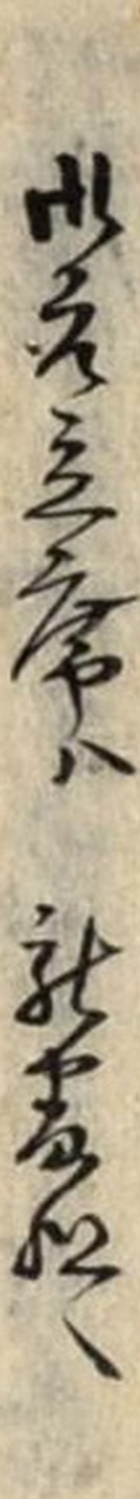御取立席は新番組へ
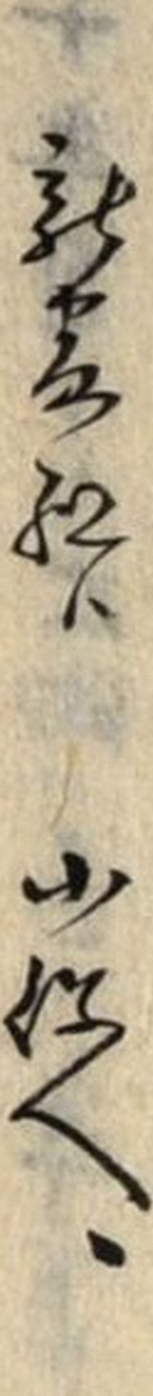新番組は小役人へ
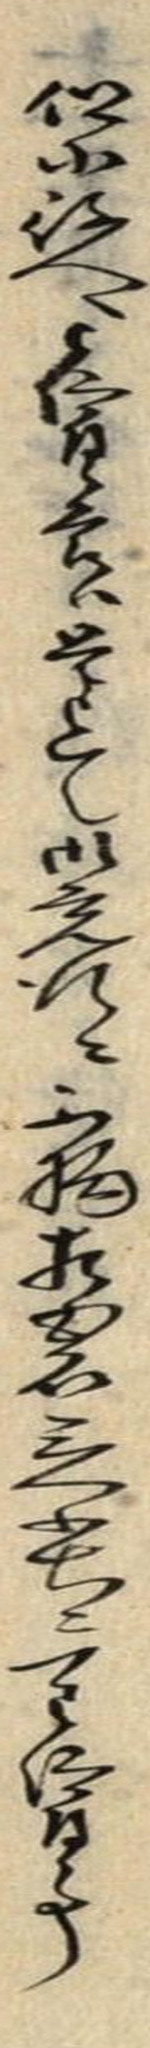但小役人へ被仰付候節は是迄之御充行に不拘拾五石三人ふちに可被仰付事

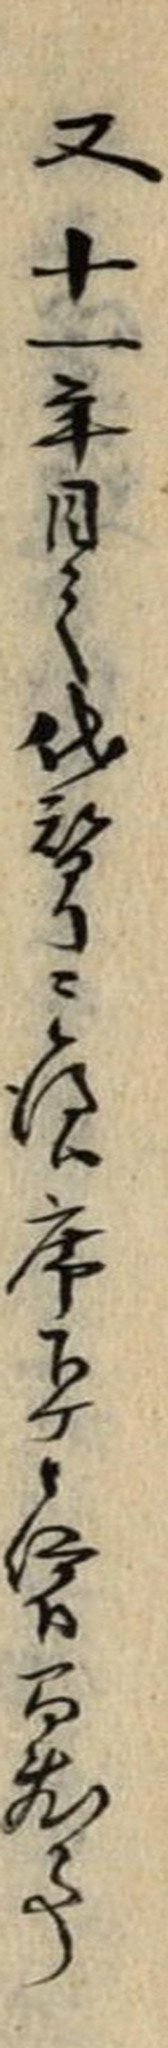又十一年目之代替りに候得は席下け被仰付間敷事
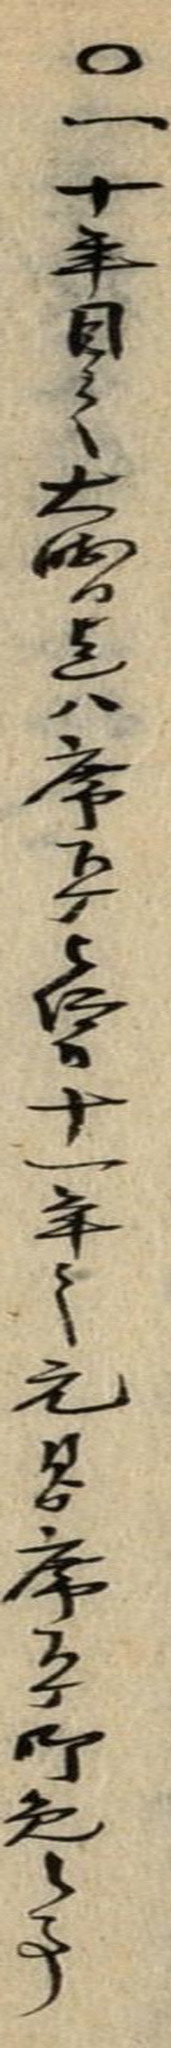○一十年目之大晦日迄は席下ケ被仰付十一年之元日ゟ席下ケ御免之事
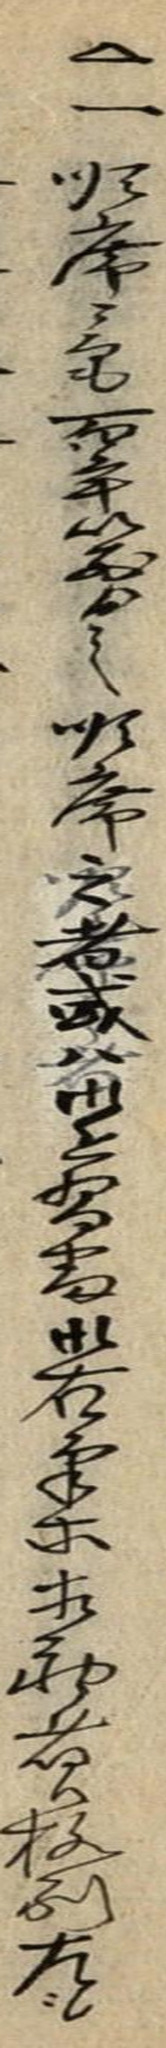△一順席に而も百年以前ゟ之順席之者或は御近習番御右筆等相勤候者は格別左も
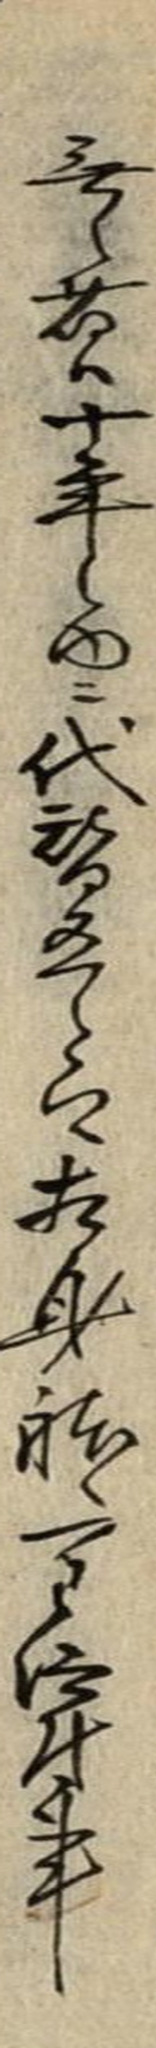無之者は十年之内に代替有之候はゝ相身体へ可被仰付事
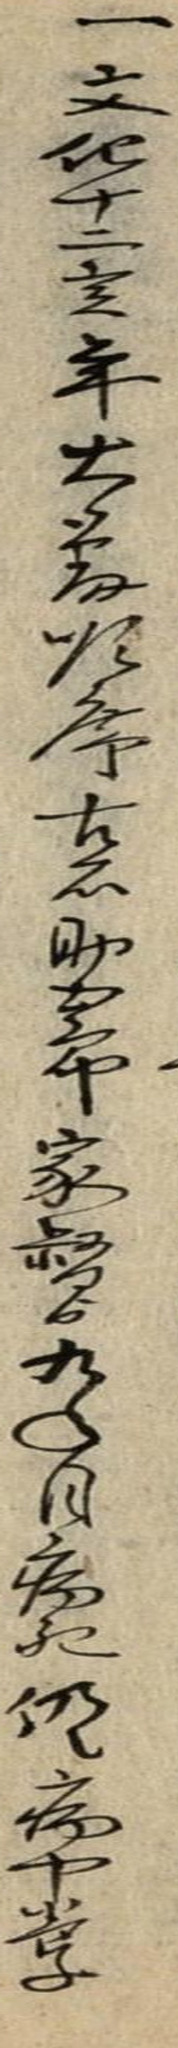一文化十二亥年大御番順席古石助五郎家督ゟ九年目病死仍之病中養子
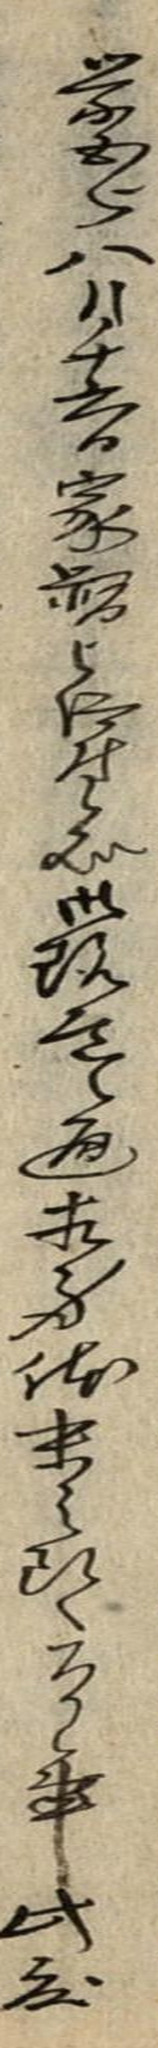栄五郎八月十六日家督被仰付候処御趣意之通相身体未之頭へ下り候事此度
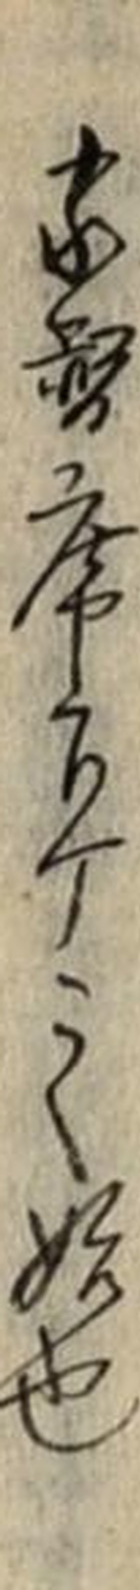家督席下ケ之始也
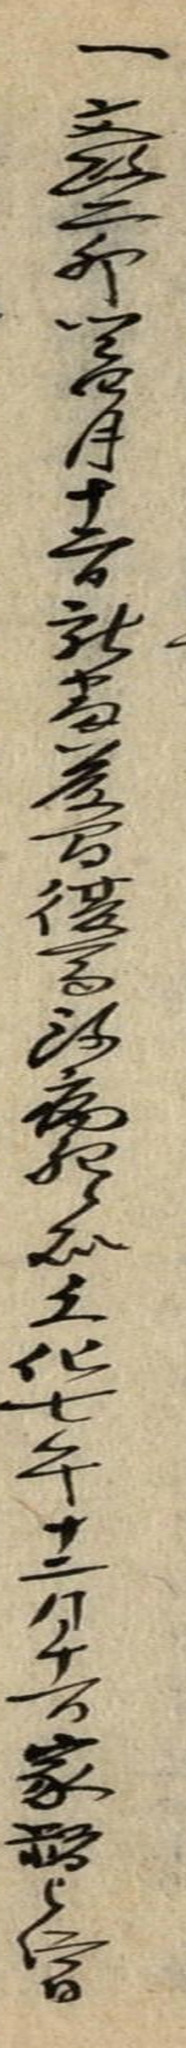一文政二卯閏四月十二日新番藤間復馬致病死候処文化七午十二月十一日家督被仰付
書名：御用并被仰出之部
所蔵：福井県文書館 Fukui Prefectural Archives
